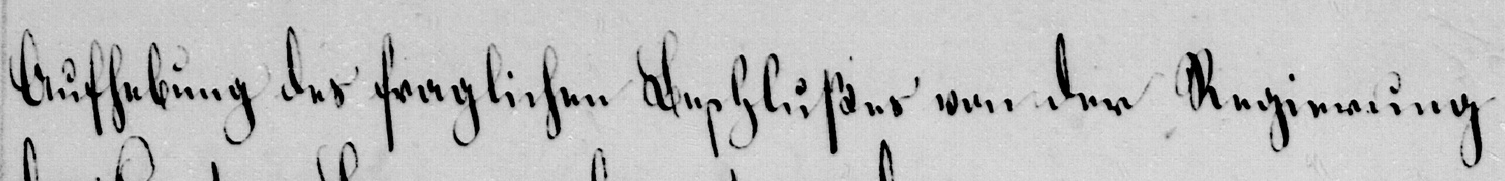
Aufklärung des fraglichen Beschlußes von der Regierung
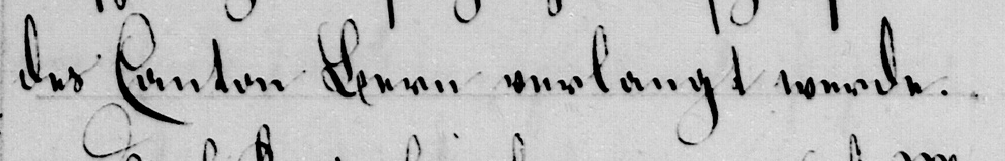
des Canton Bern verlangt werde.
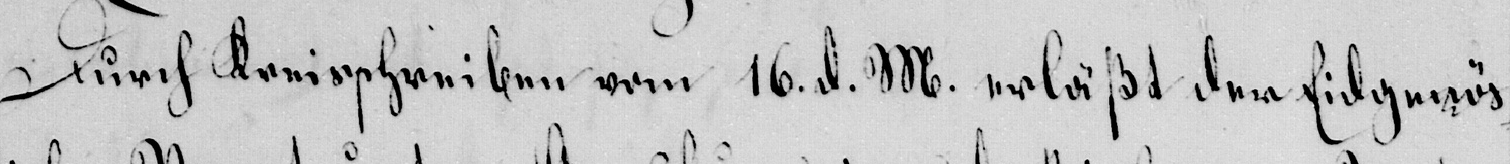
Durch Kreisschreiben vom 16. d. M. erläßt der Eidgenöß¬
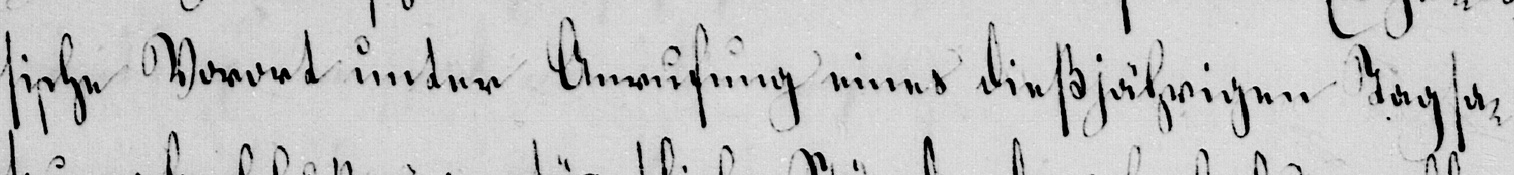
ische Vorort unter Anrufung eines dießjährigen Tagsa¬
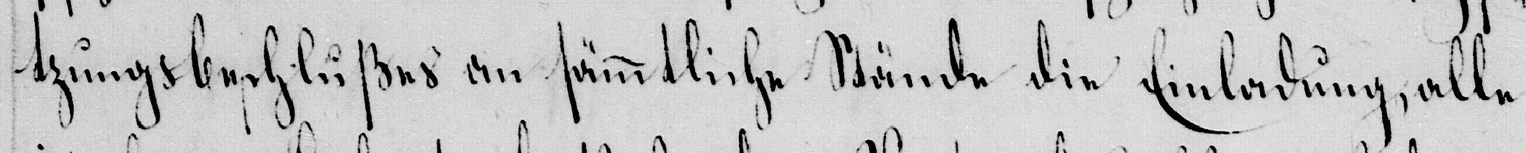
tzungsbeschlußes an sämmtliche Stände die Einladung, alle
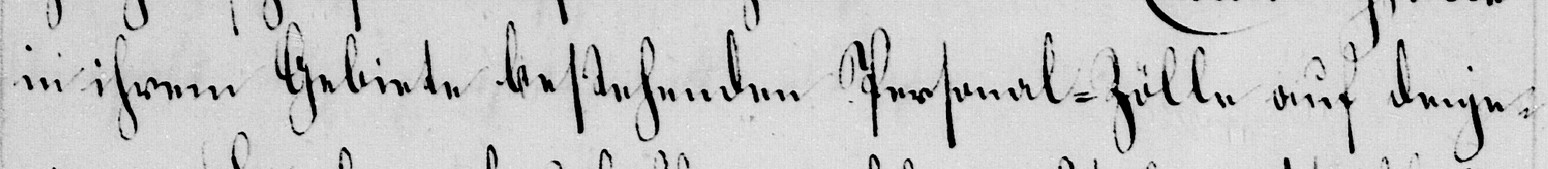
in ihrem Gebiete bestehenden Personal-Zölle auf denje¬
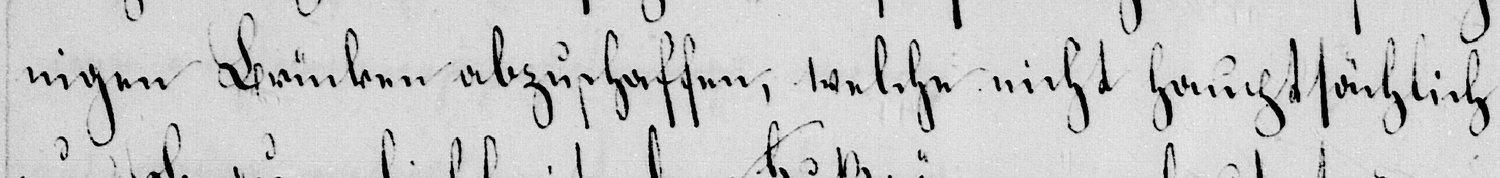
nigen Brücken abzuschaffen, welche nicht hauptsächlich
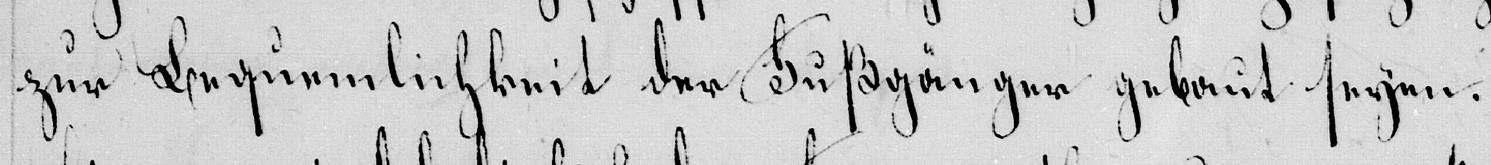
zur Bequemlichkeit der Fußgänger gebaut seyen.
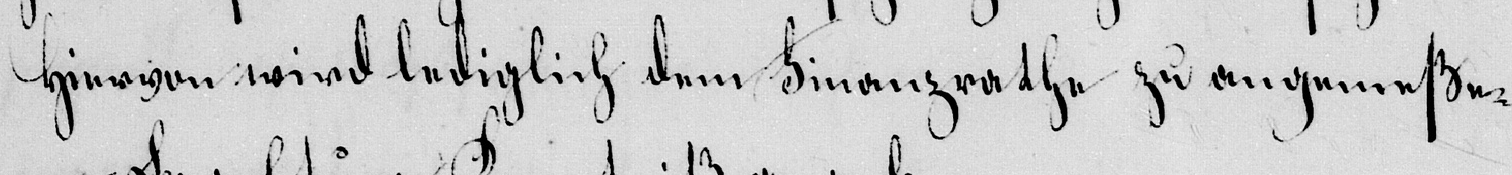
Hiervon wird lediglich dem Finanzrathe zu angemeße¬
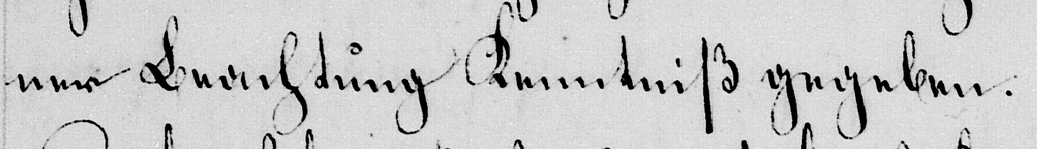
ner Beachtung Kenntniß gegeben.
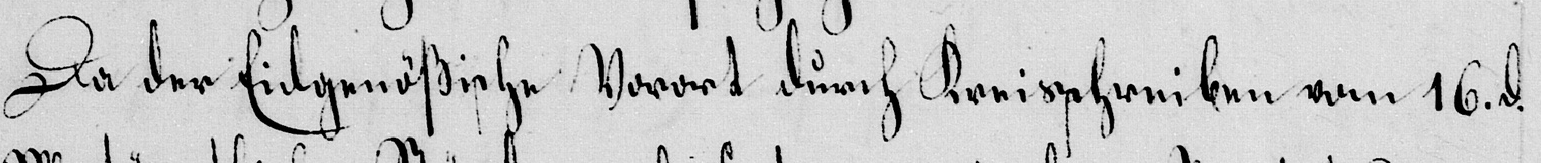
Da der Eidgenößische Vorort durch Kreisschreiben vom 16. d.
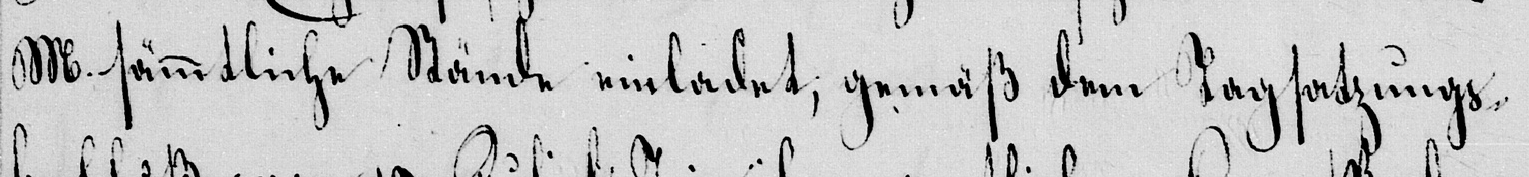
M. sämmtliche Stände einladet, gemäß dem Tagsatzungs¬
